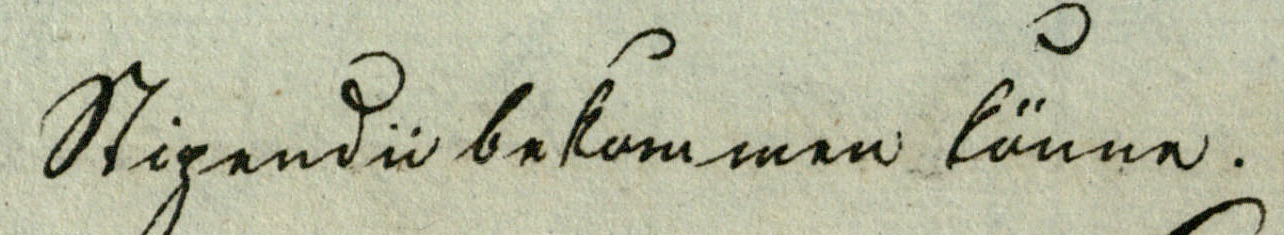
Stipendii bekommen könne.
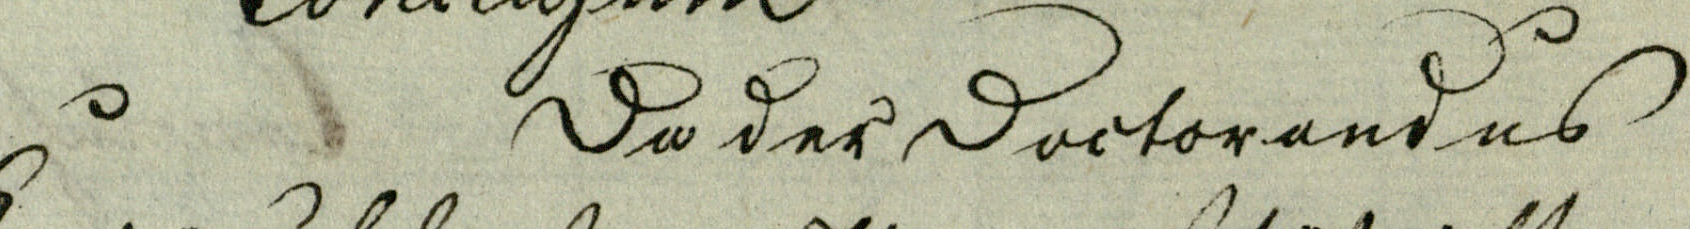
Da der Doctorandus
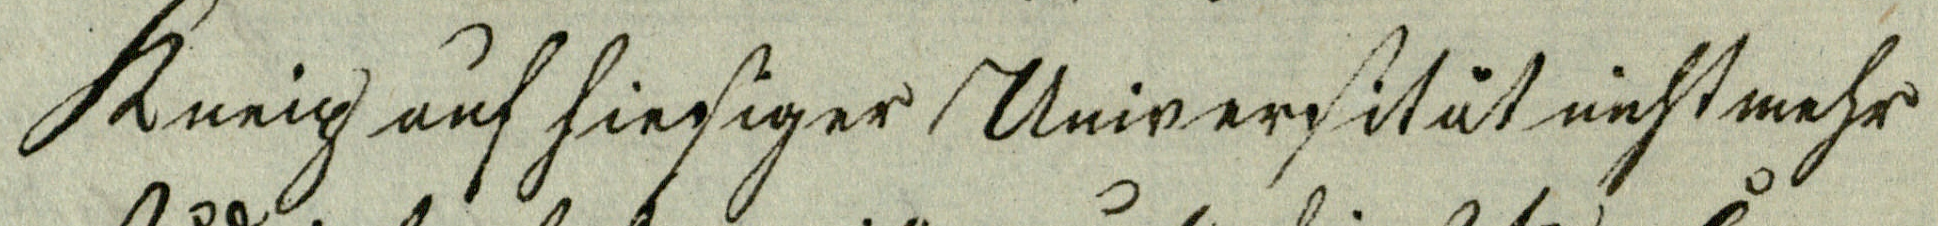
Kneip auf hiesiger Universität nichtmehr
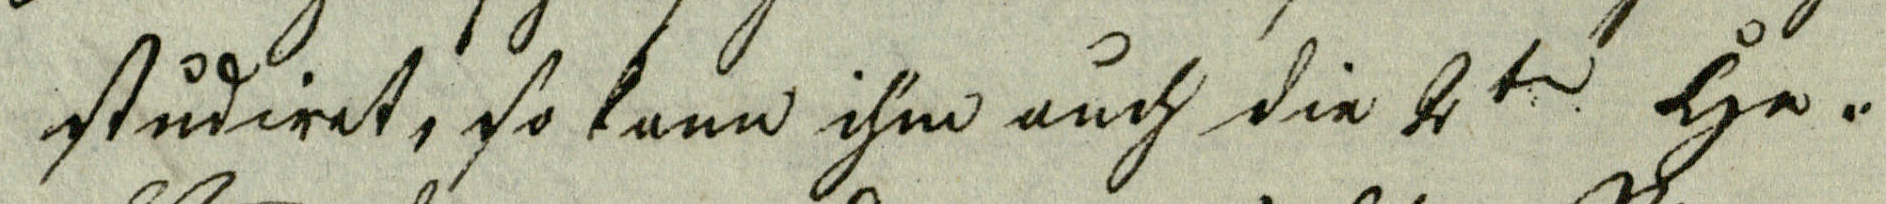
studiret, so kann ihm auch die 2te He¬
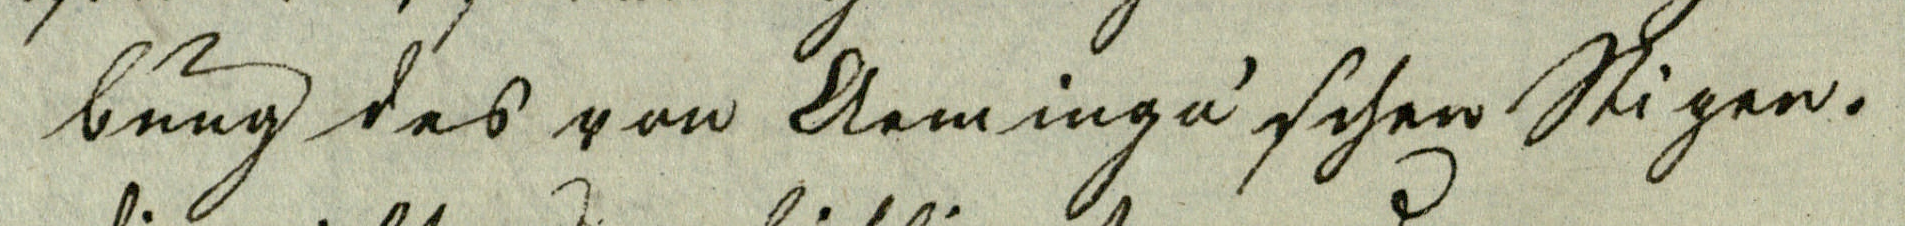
bung des von Aeminga'schen Stipen¬
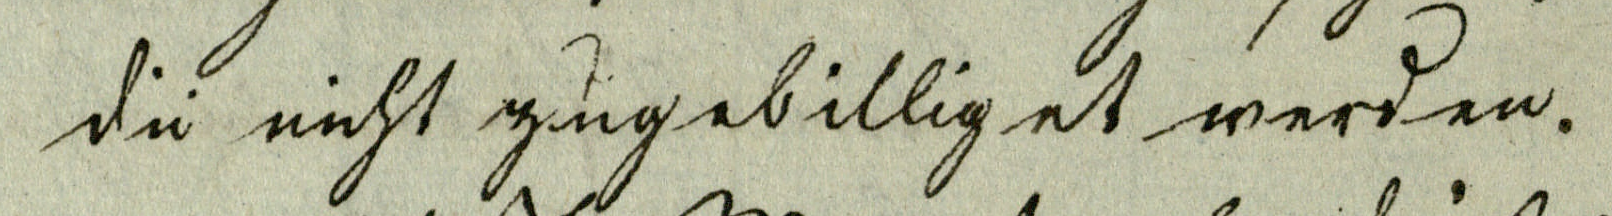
dii nicht zugebilliget werden.
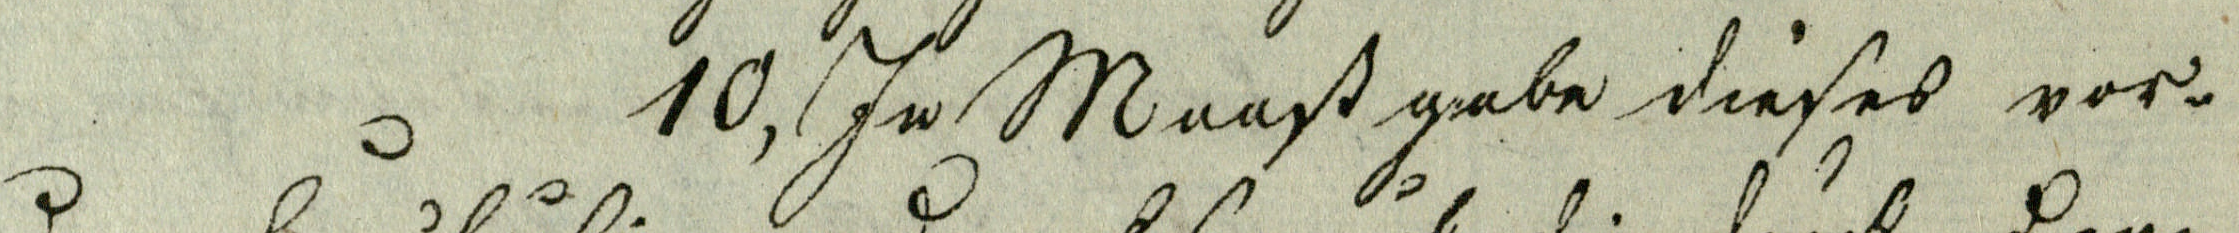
10, In Maaßgabe dieses vor¬
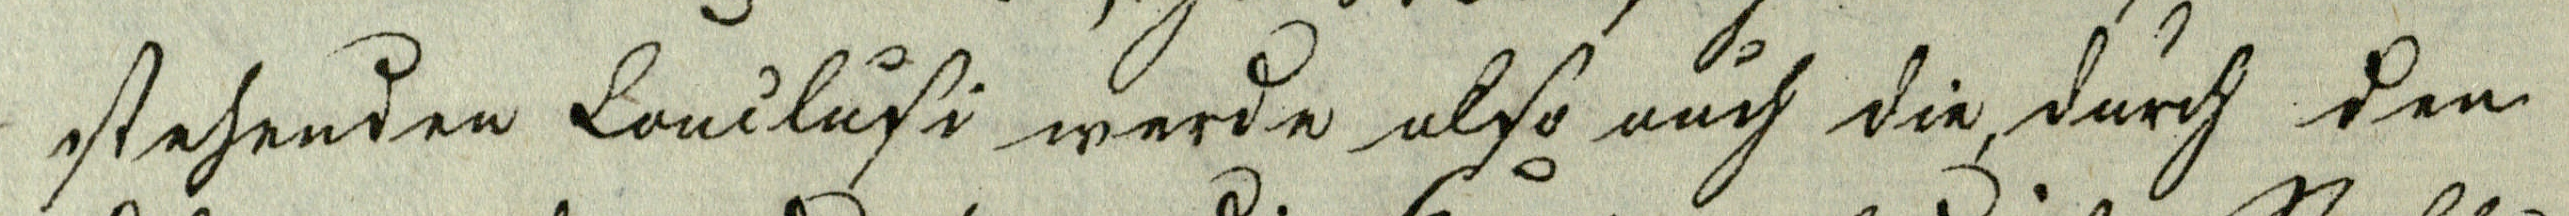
stehenden Conlusi werde also auch die, durch den
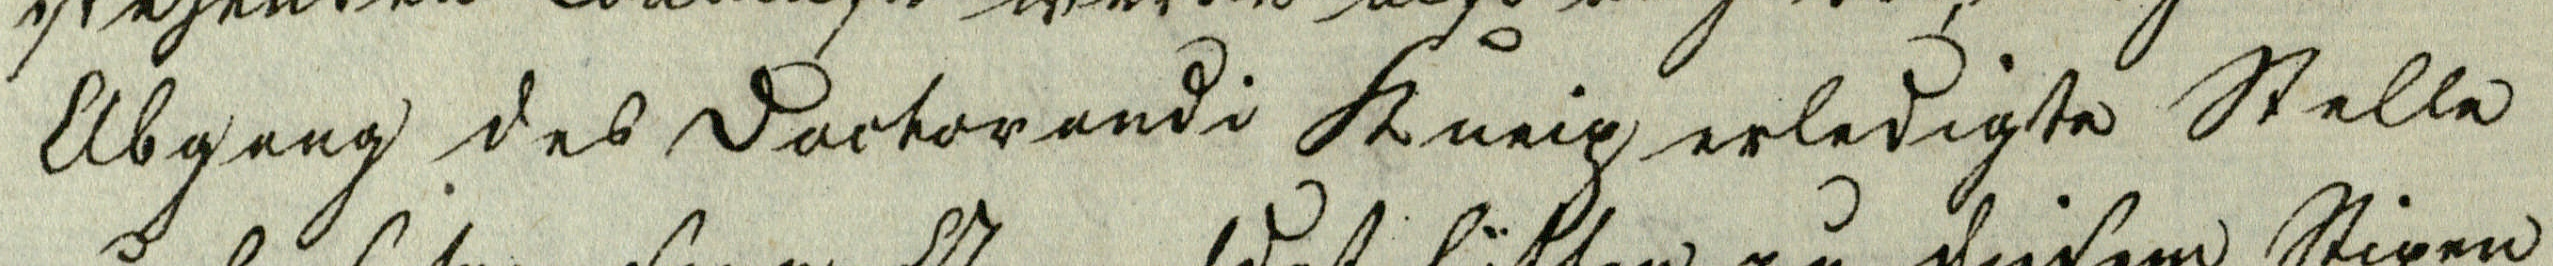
Abgang des Doctorandi Kneip erledigte Stelle
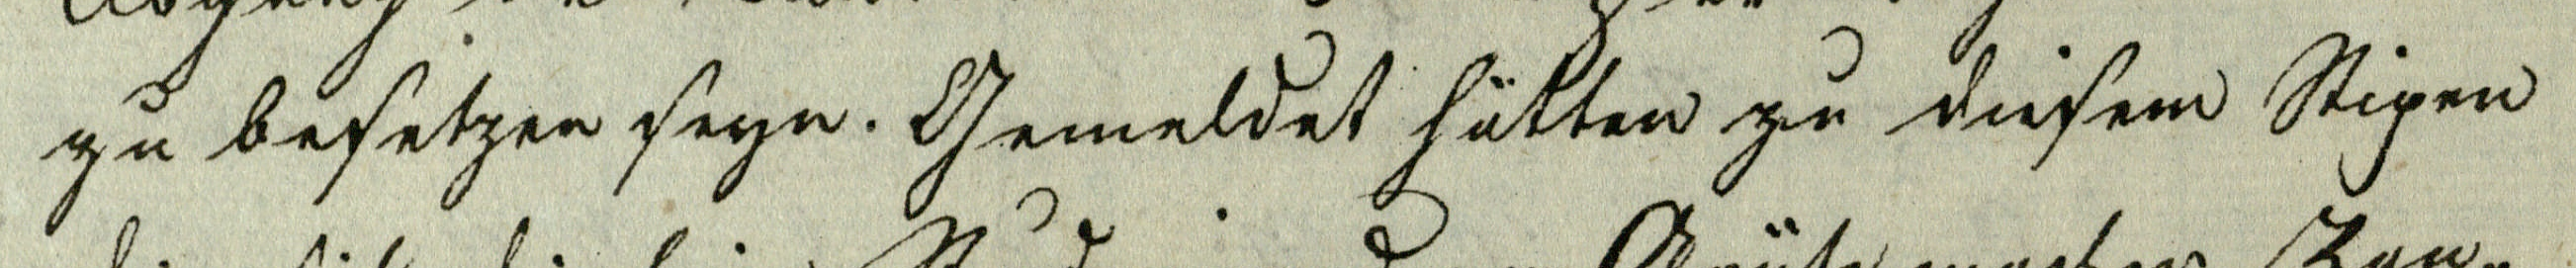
zu besetzen seyn. Gemeldet hätten zu diesem Stipen¬
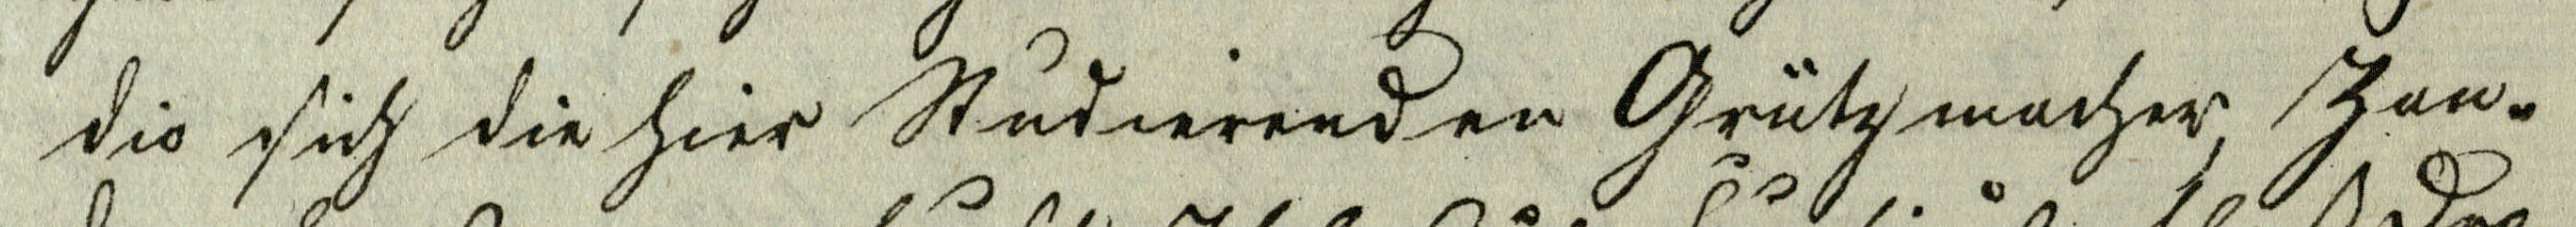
dio sich die hier Studierenden Grützmacher, Zan¬
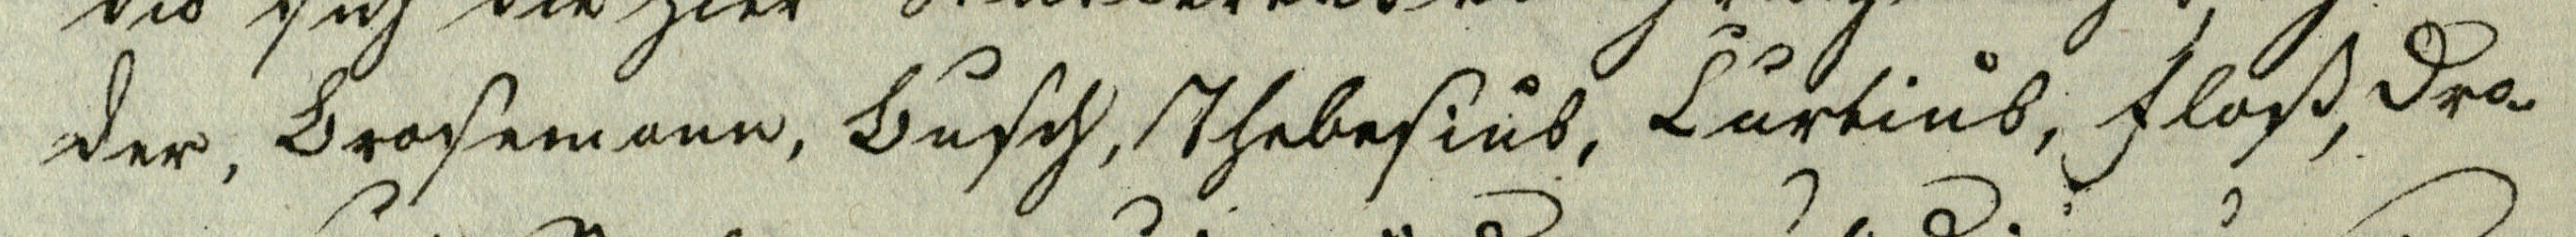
der, Brosemann, Busch, Thebesius, Curtius, Floß, Dro¬
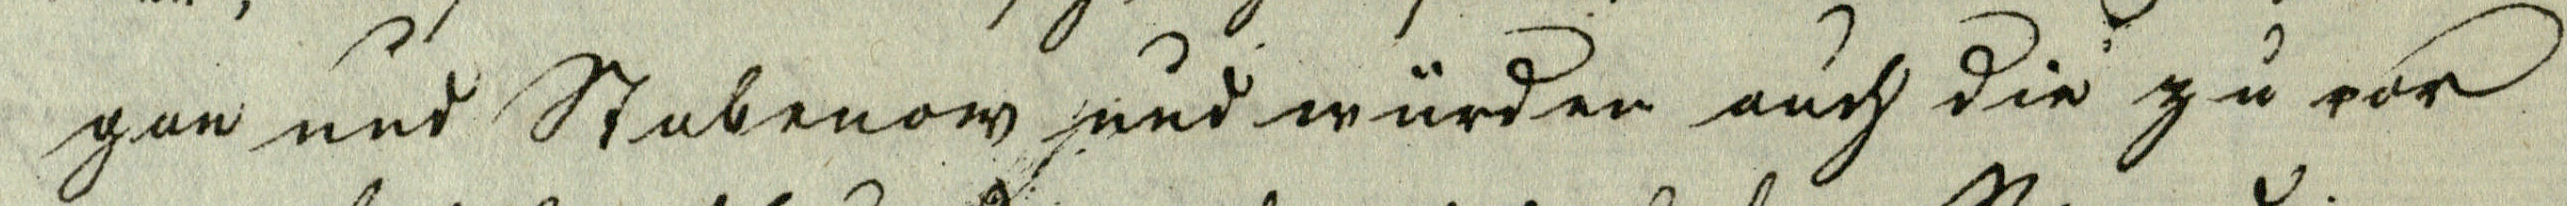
gan und Stabenow, und würden auch die zuvor
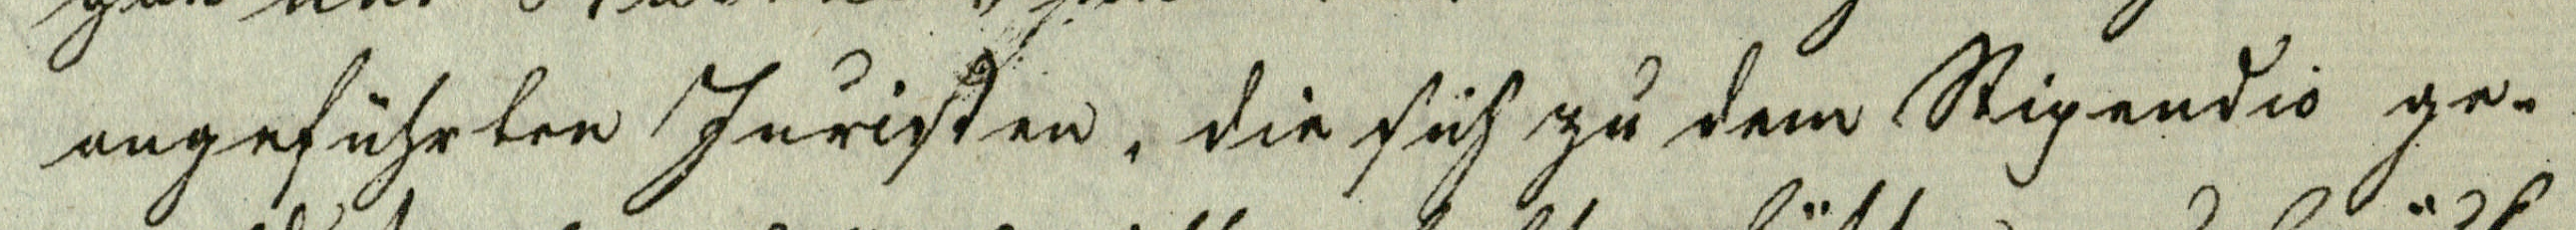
angeführten Juristen, die sich zu dem Stipendio ge¬
